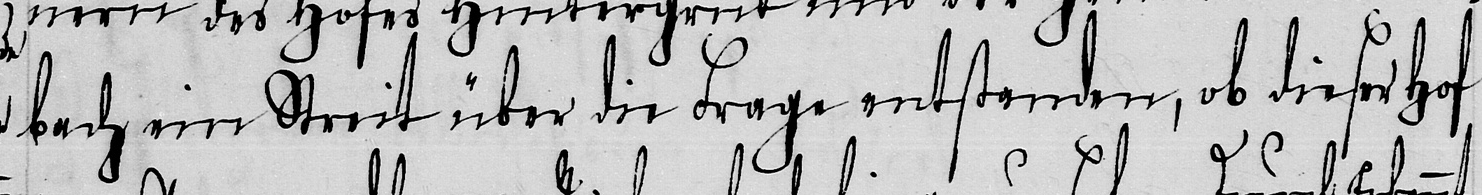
bach ein Streit über die Frage entstanden, ob dieser Hof
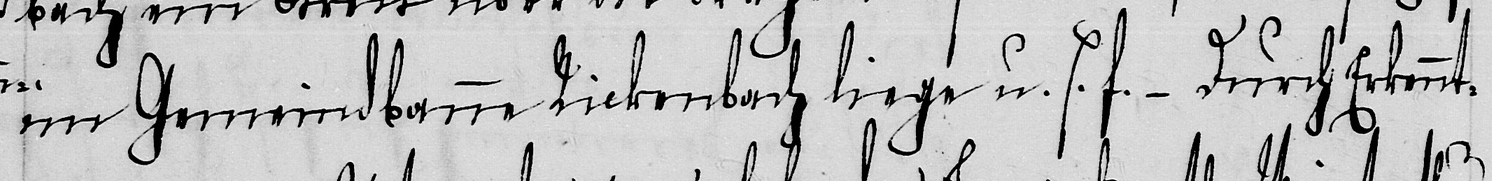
im Gemeindbanne Rickenbach liege u. s. f. – Durch Erke¬
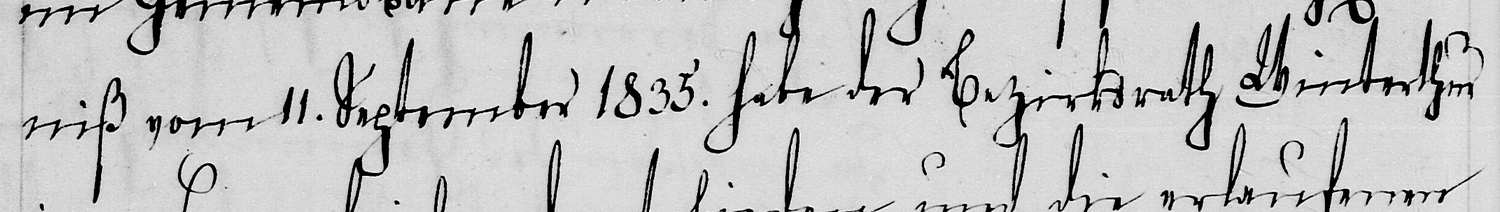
niß vom 11. September 1835. habe der Bezirksrath Winterthur
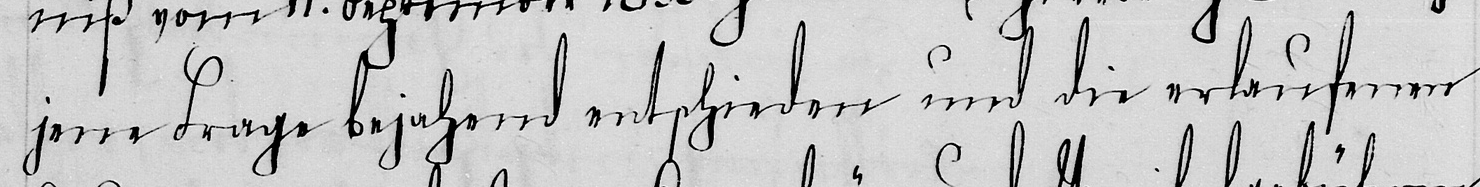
jene Frage bejahend entschieden und die erlaufenen
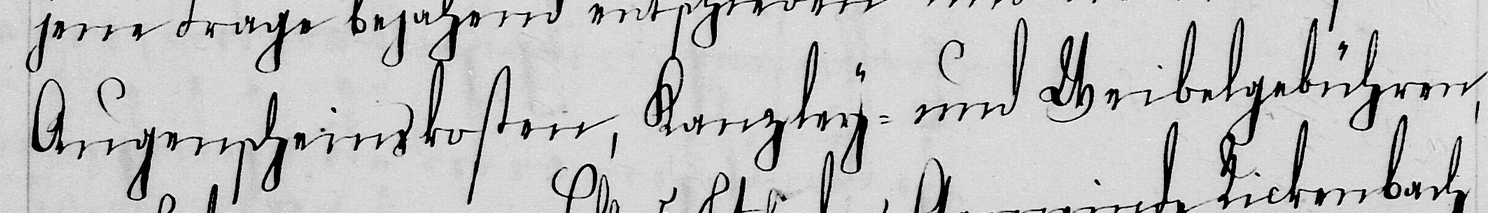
Augenscheinskosten, Kanzley- und Weibelgebühren,
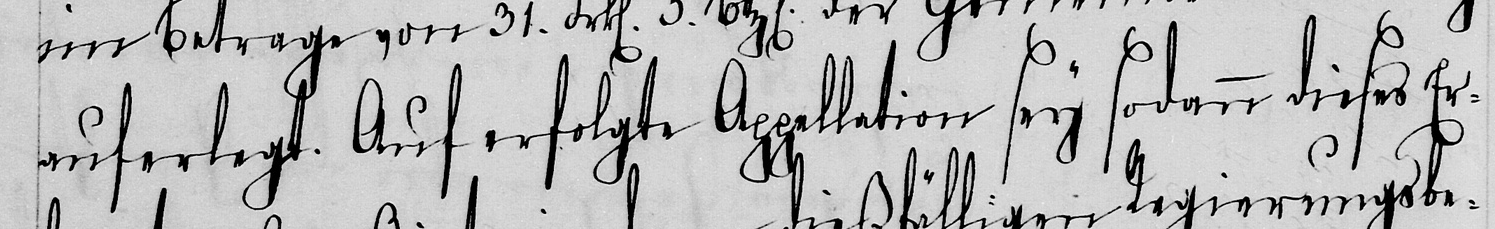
auferlegt. Auf erfolgte Appellation sey sodann dieses
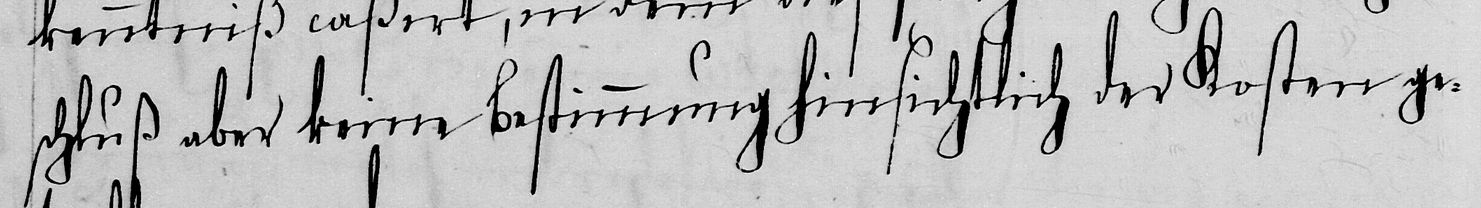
schluß aber keine Bestimmung hinsichtlich der Kosten ge¬
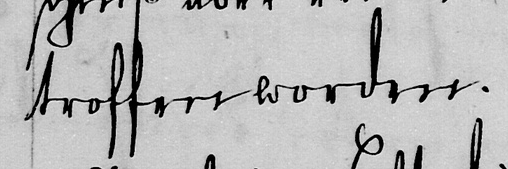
troffen worden.
